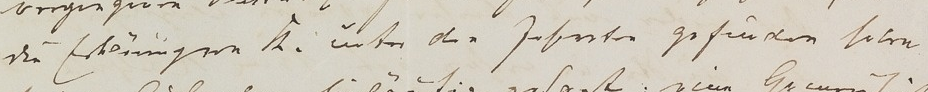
die Erklärung von K. unter den Inseraten gefunden haben
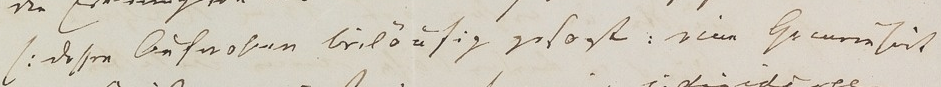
(: dessen Aufnahme beiläufig gesagt: eine Gemeinheit
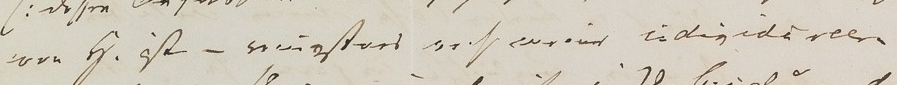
von H. ist – wenigstens nach meiner individuellen
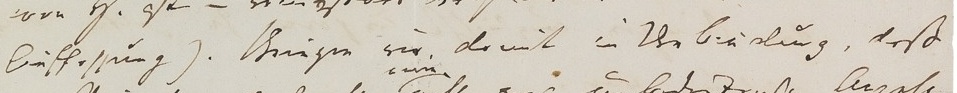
Auffassung). Bringen wir damit in Verbindung, daß
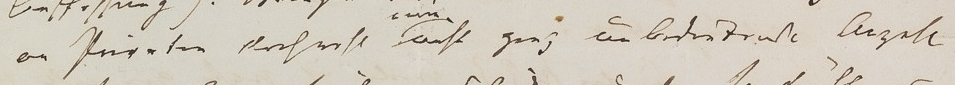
an Privaten doch wohl eine nicht ganz unbedeutende Anzahl
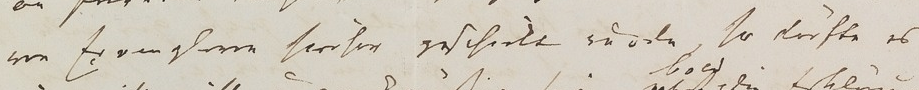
von Exemplaren hierher geschickt wurde, so dürfte es
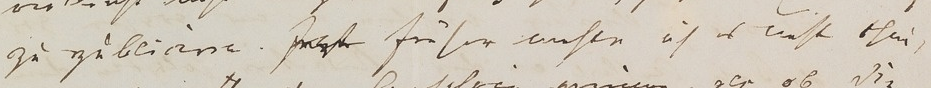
zu publiciren. Jetzt Früher mochte ich es nicht thun,
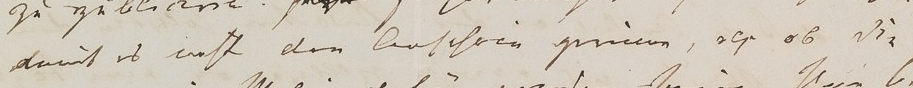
damit es nicht den Anschein gewinne, als ob die
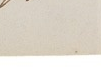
eine
